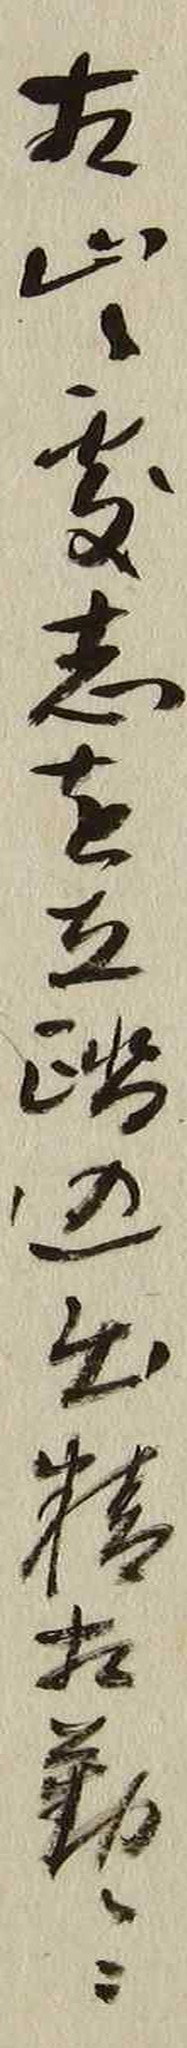相止候処志を立踏込出精相勤候ニ
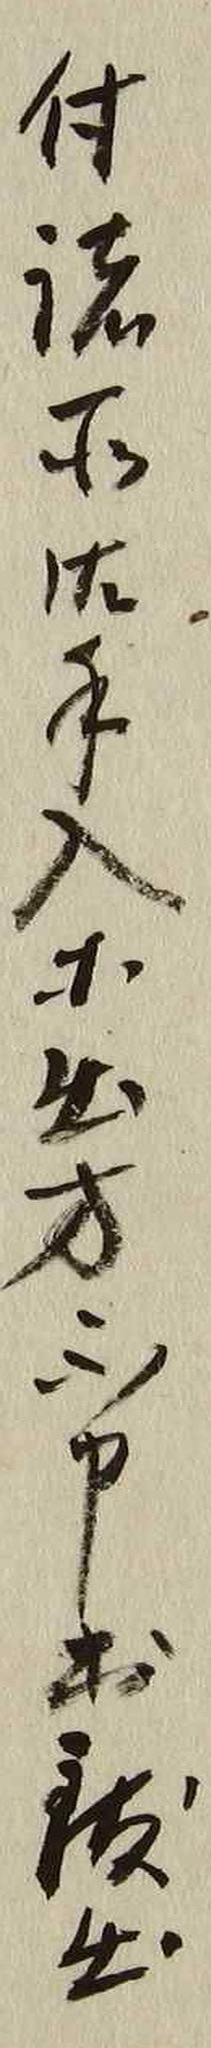付諸所御手入等出方不申出致出
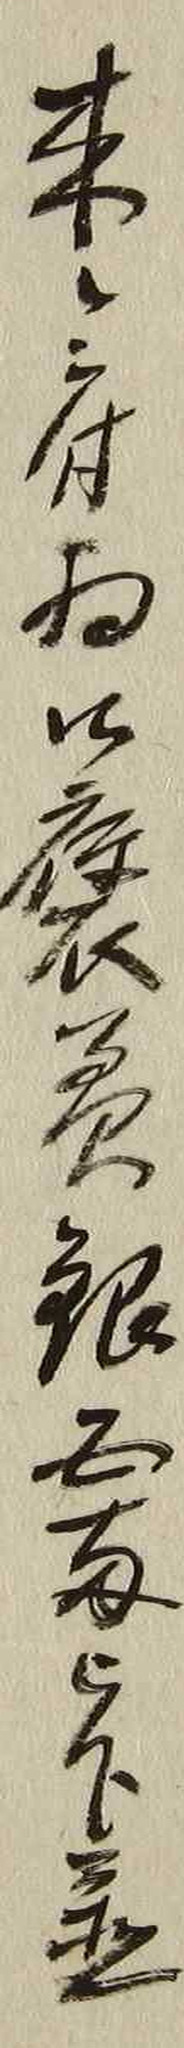来候ニ付為御褒美銀五両被下置
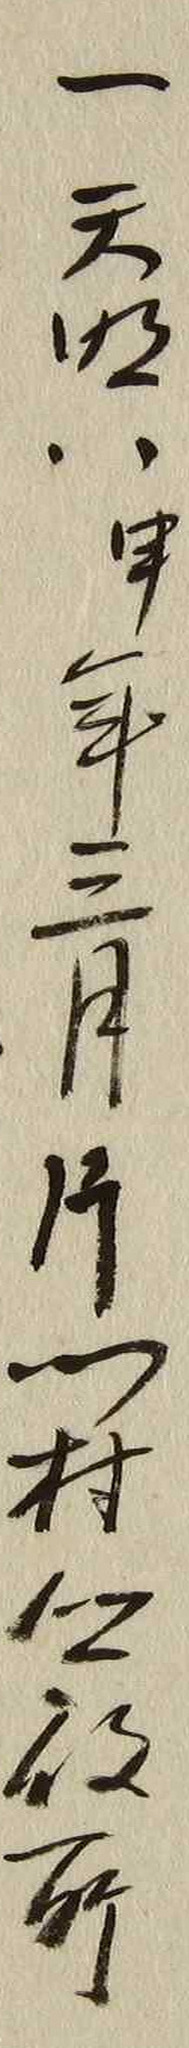一天明八申年三月片門村郷役所
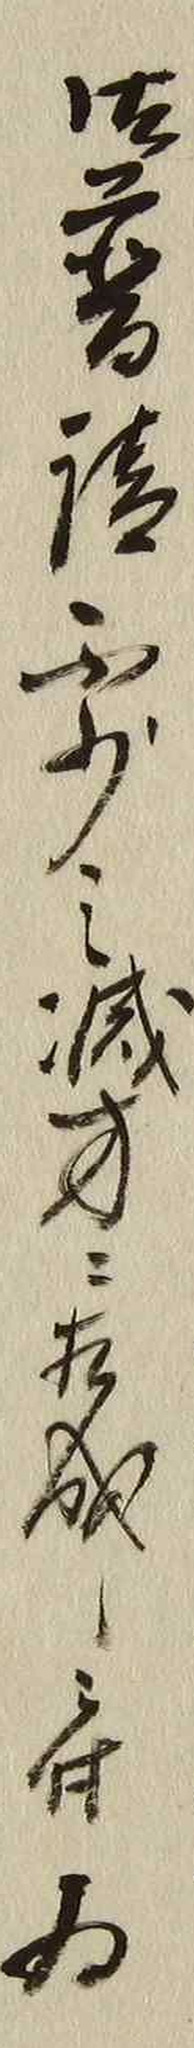御普請不少之減方ニ相成候ニ付為
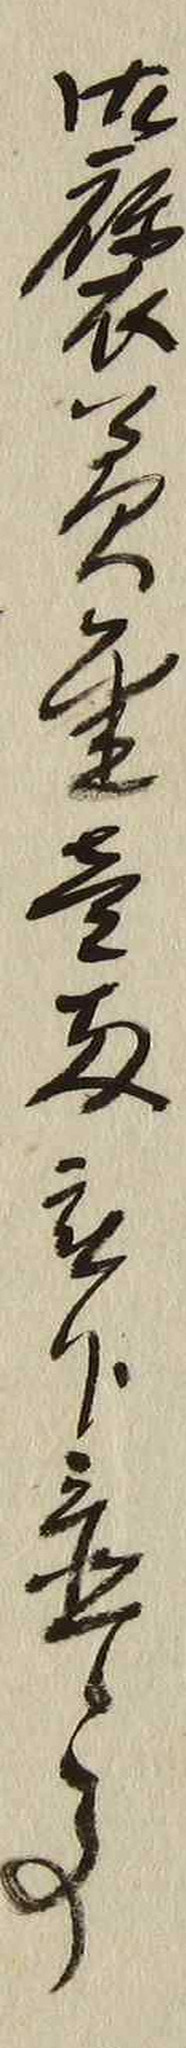御褒美金壱両被下置候事
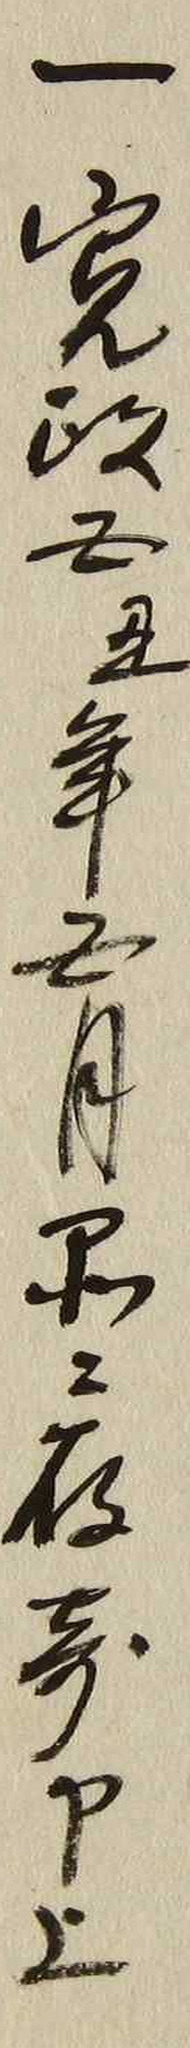一寛政五丑年五月品々存寄申上
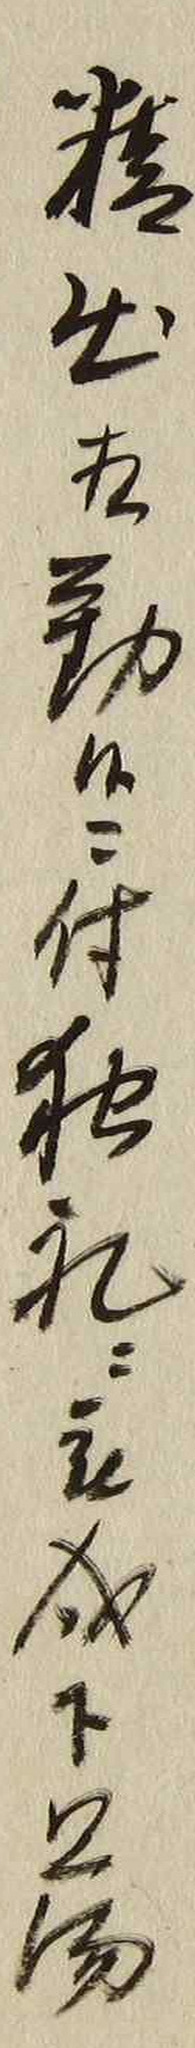精出相勤候ニ付独礼ニ被成下且湯
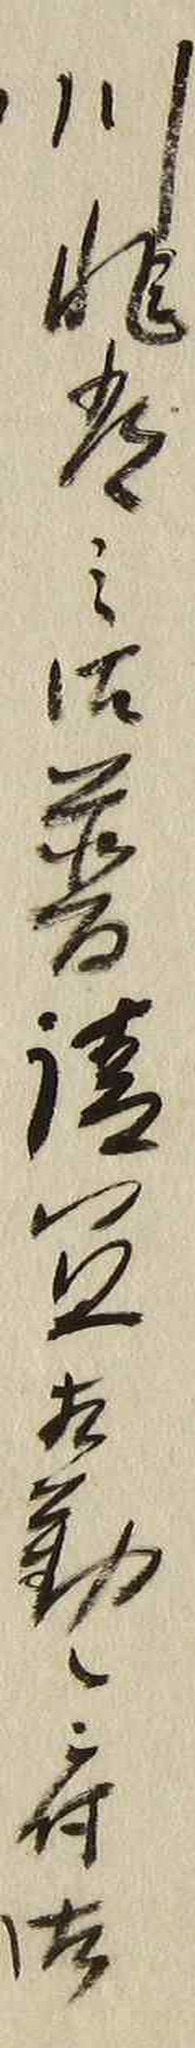川非常之御普請宜相勤候ニ付御
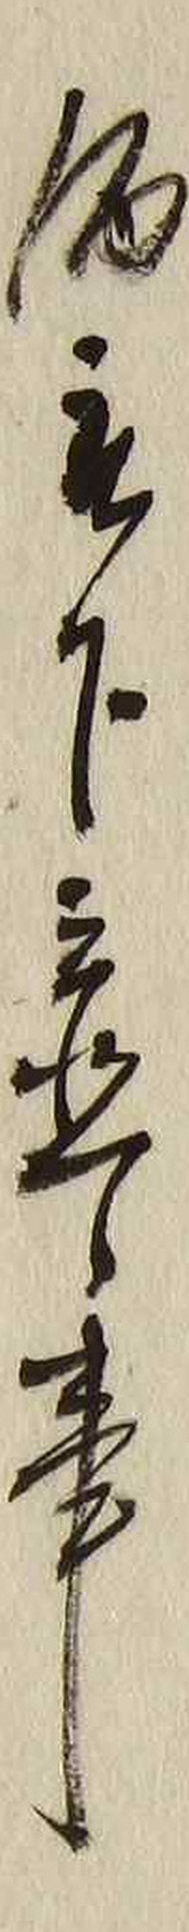酒被下置候事
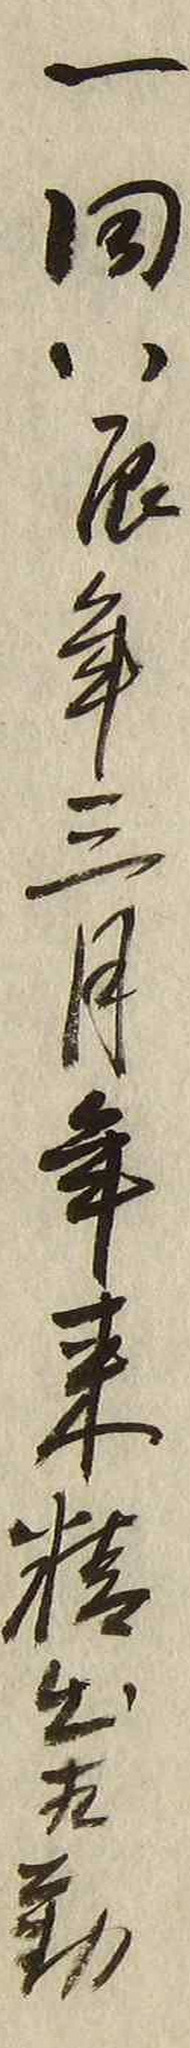一同八辰年三月年来精出相勤
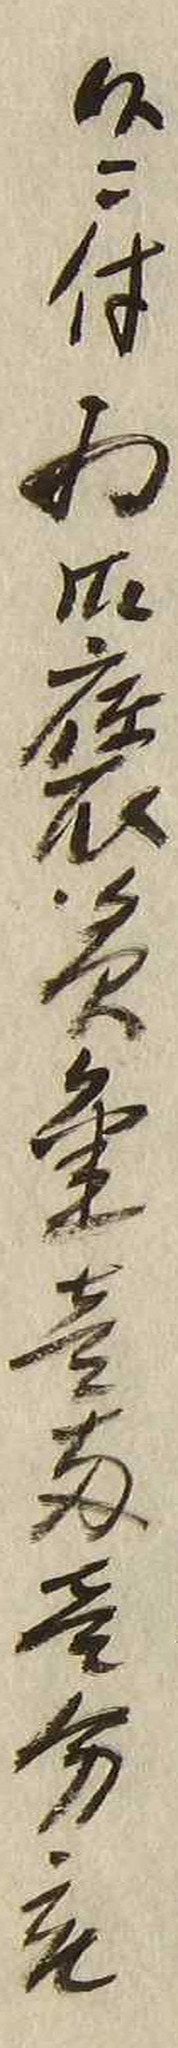候ニ付為御褒美金壱両壱分被

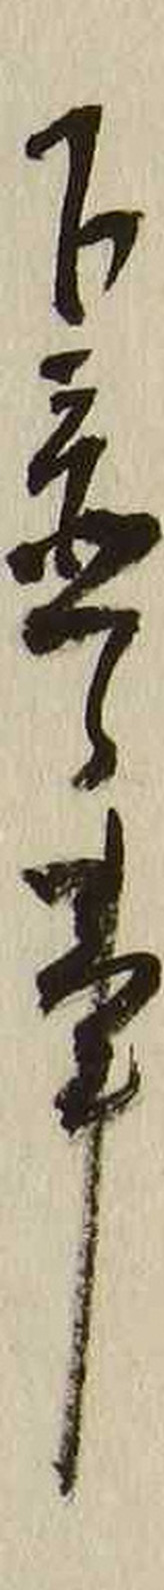下置候事
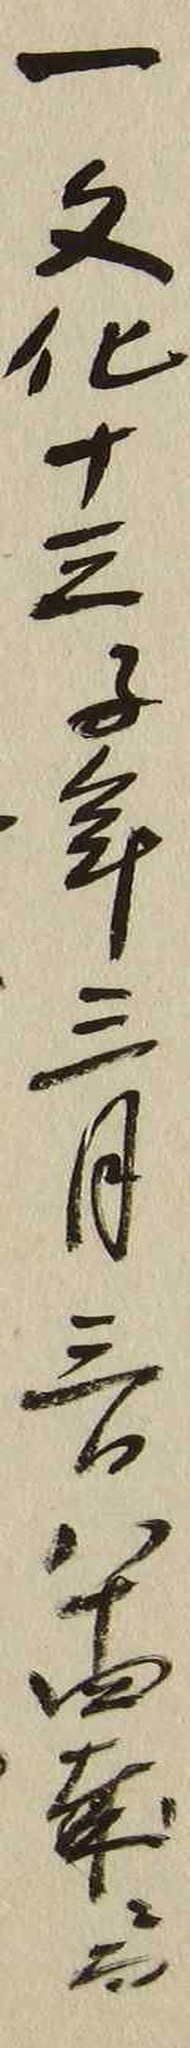一文化十三子年三月三日八十四歳ニ而
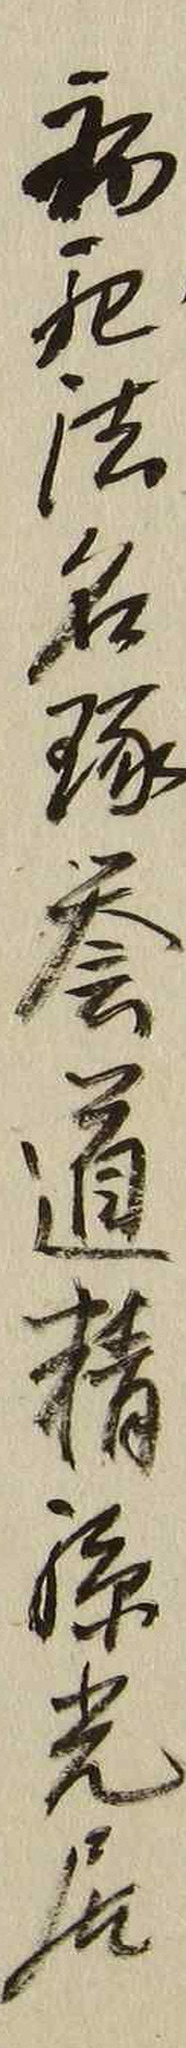病死法名琢誉道精孫光居
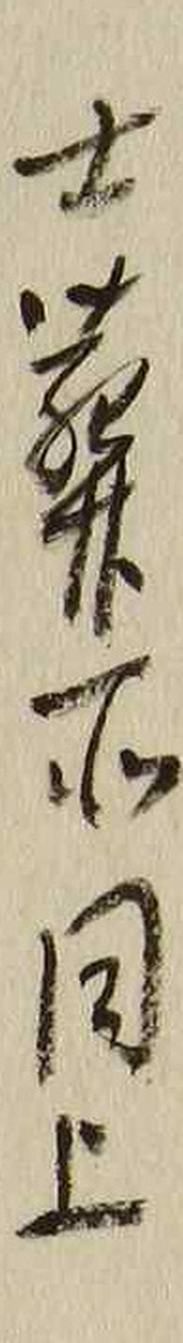士葬所同上
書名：諸士系譜　巻之353　す之部3
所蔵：会津若松市立会津図書館
